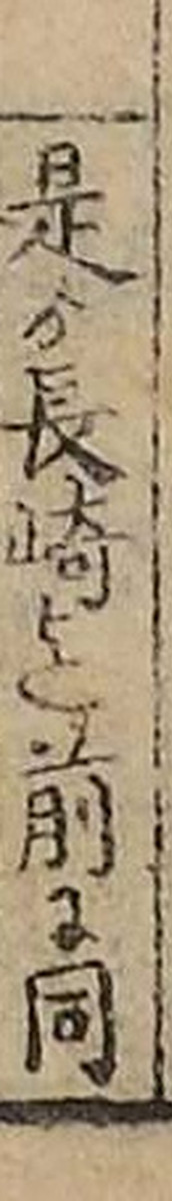是ゟ長崎迄前に同
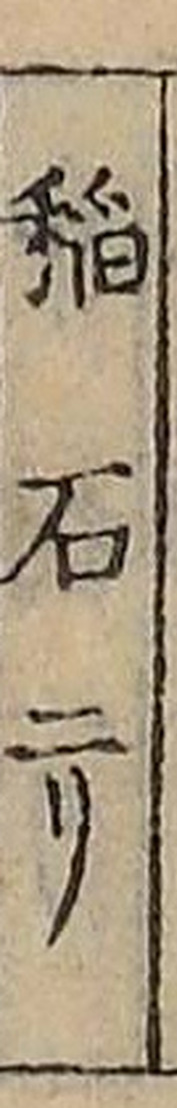稲石二リ
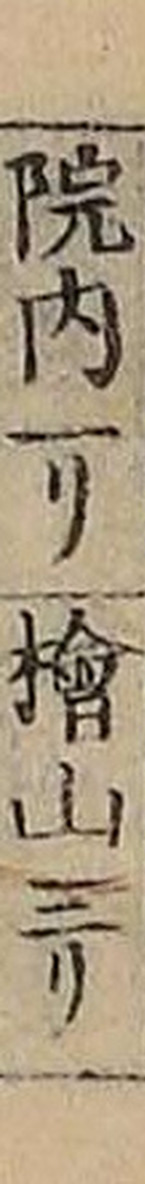院内一リ桧山三リ
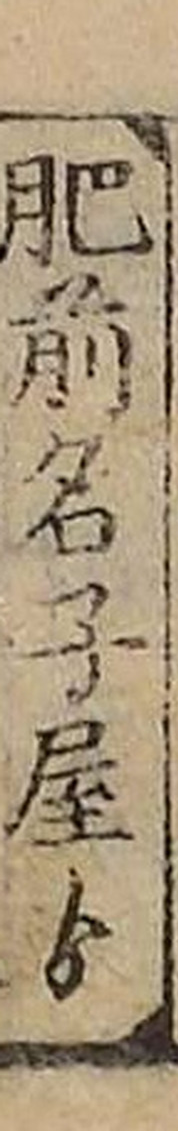肥前名子屋ゟ
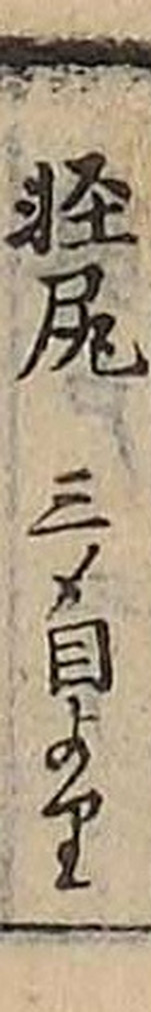軽尻三貫目より
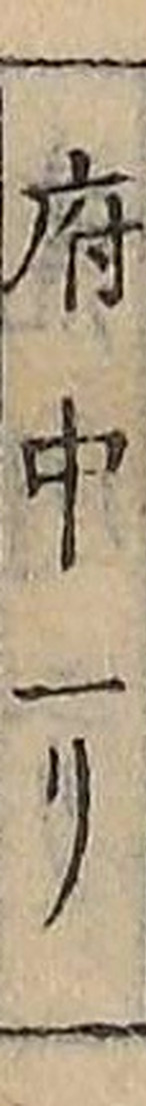府中一リ
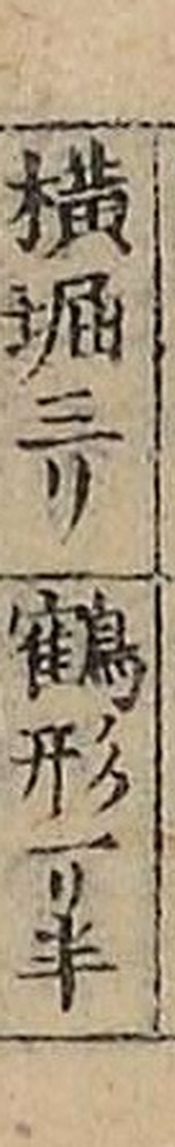横堀三リ鶴形一リ半
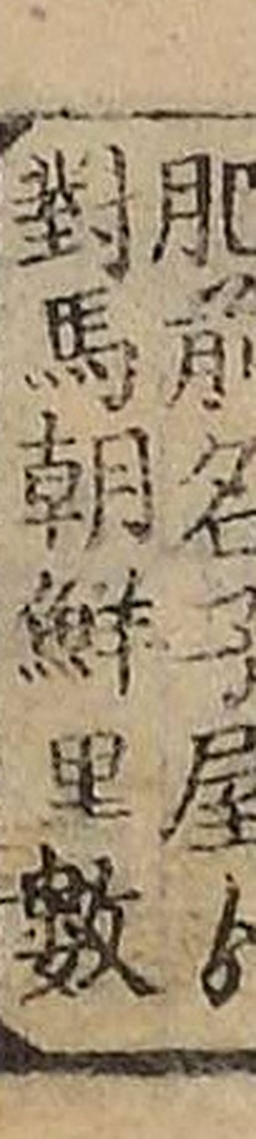対馬朝鮮里数
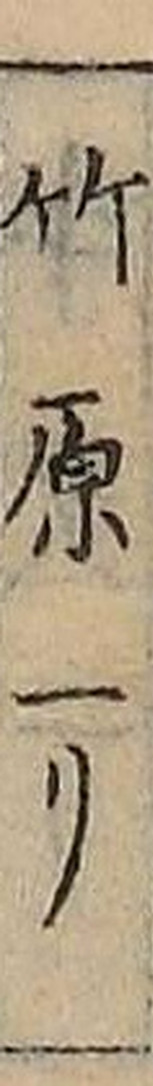竹原一リ
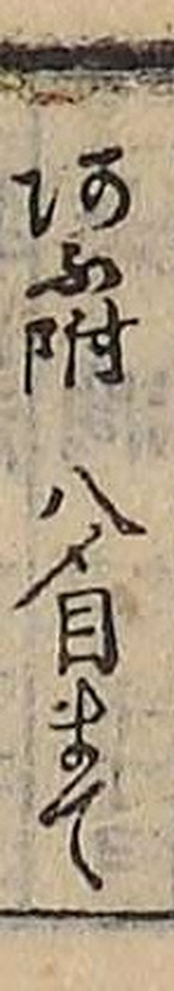あふ附八貫目まて
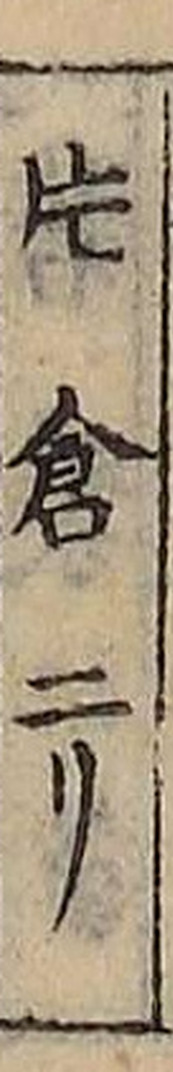片倉二リ
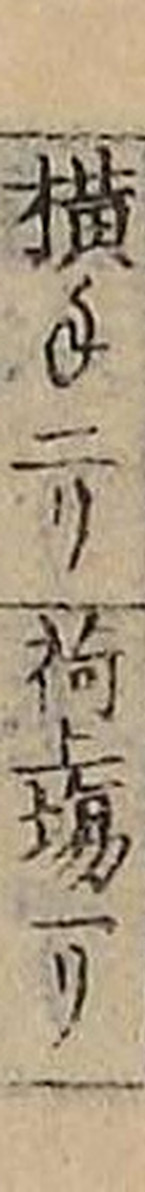横手二リ荷上場一リ
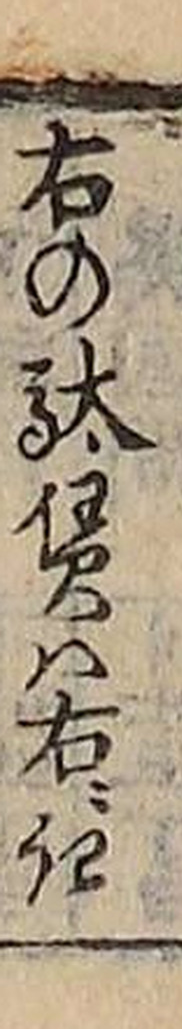右の駄賃は右記
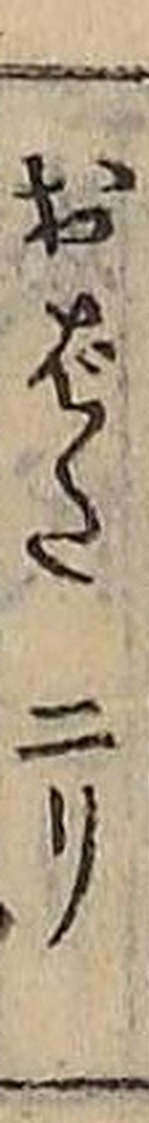おばた二リ
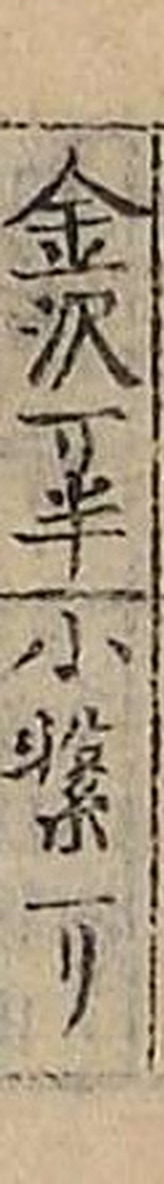金沢一リ半小繋一リ
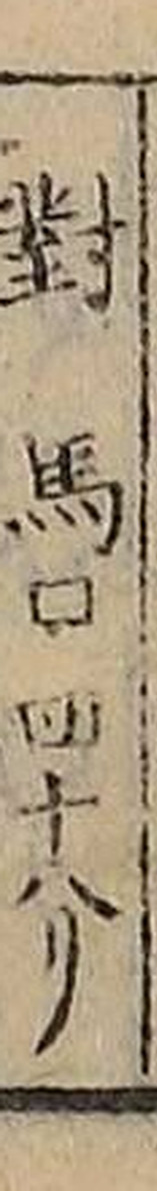対馬▫四十八リ
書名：旅行用心集
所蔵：神戸大学附属図書館 国文学研究資料館
